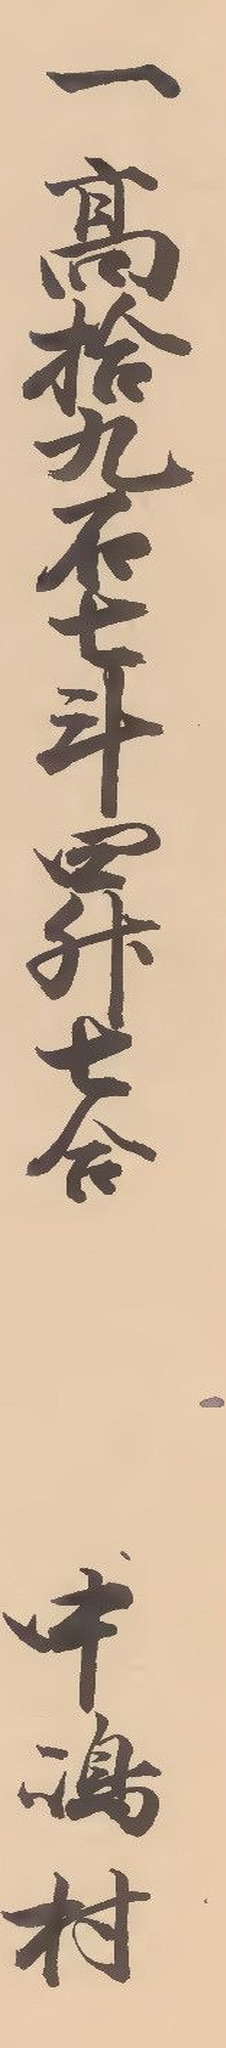一高拾九石七斗四升七合中島村
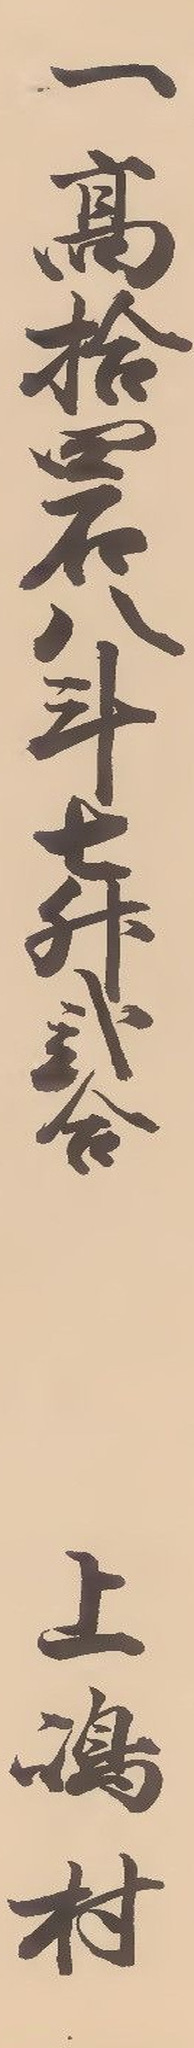一高拾四石八斗七升弐合上島村
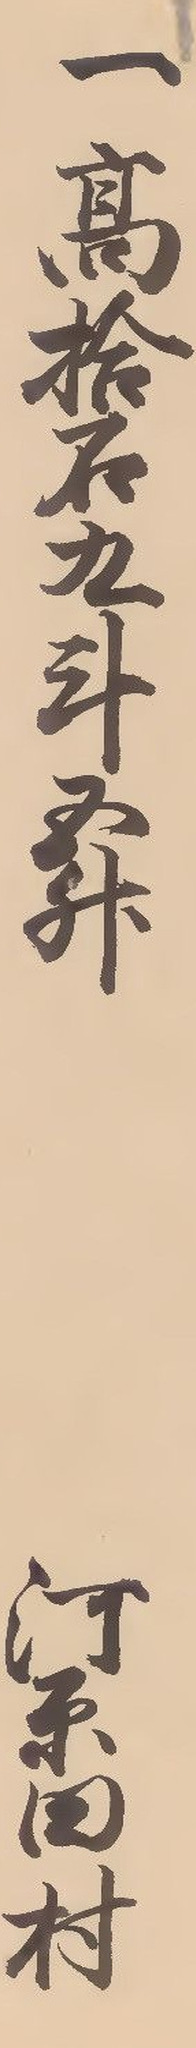一高拾石九斗五升河原田村
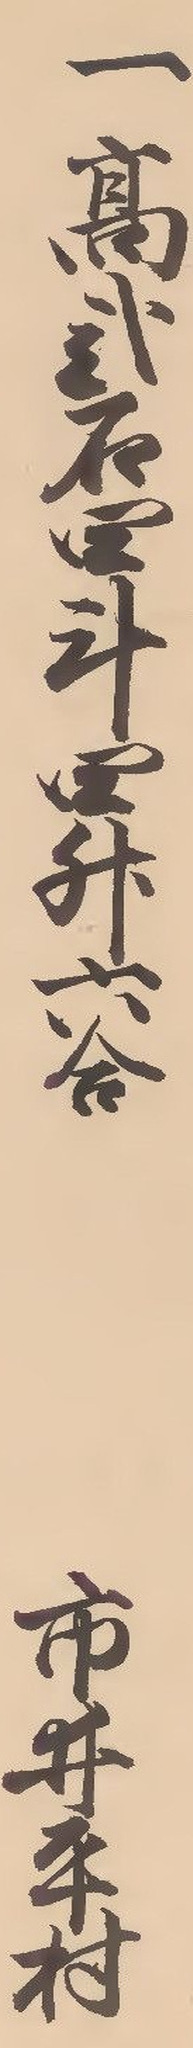一高弐石四斗四升六合市井平村
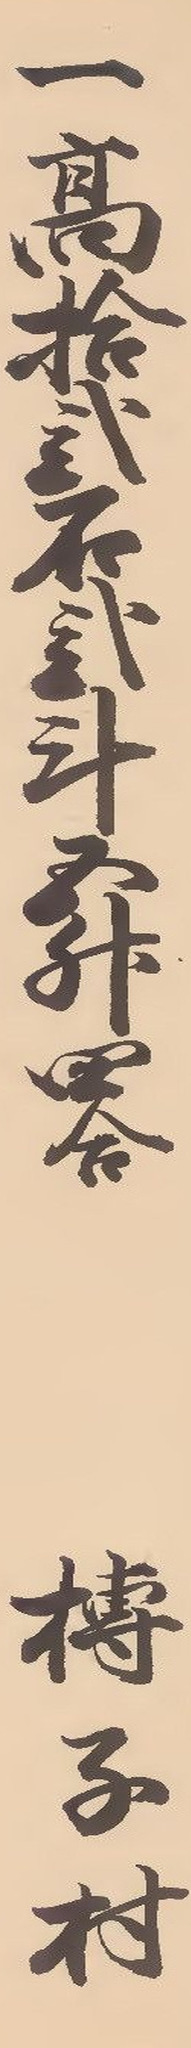一高拾弐石弐斗五升四合榑子村
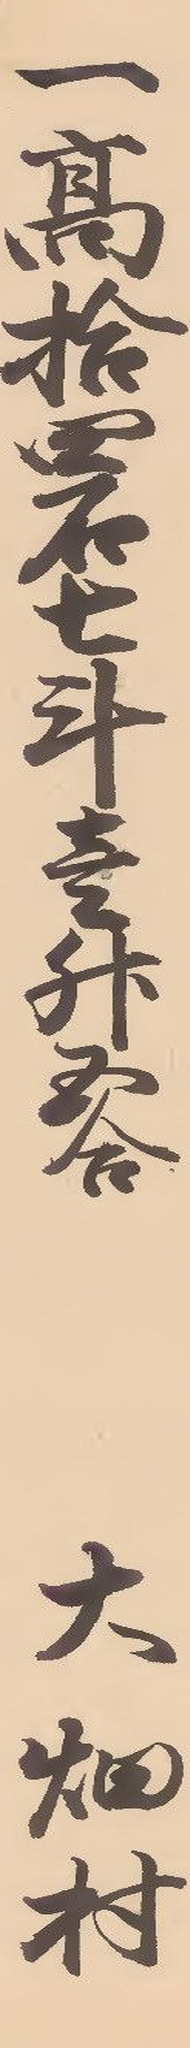一高拾四石七斗壱升五合大畑村
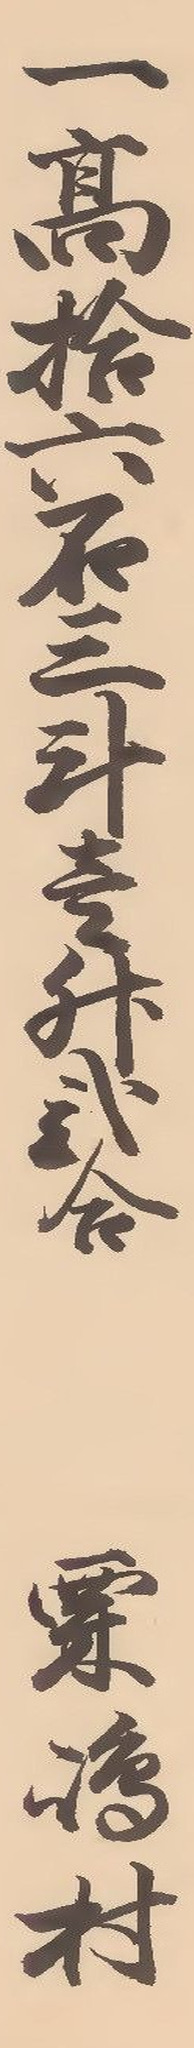一高拾六石三斗壱升弐合栗島村

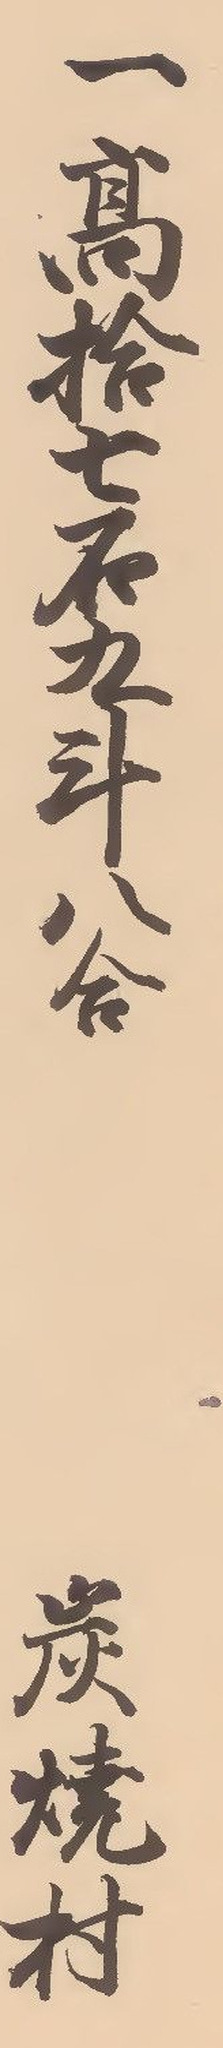一高拾七石九斗八合炭焼村
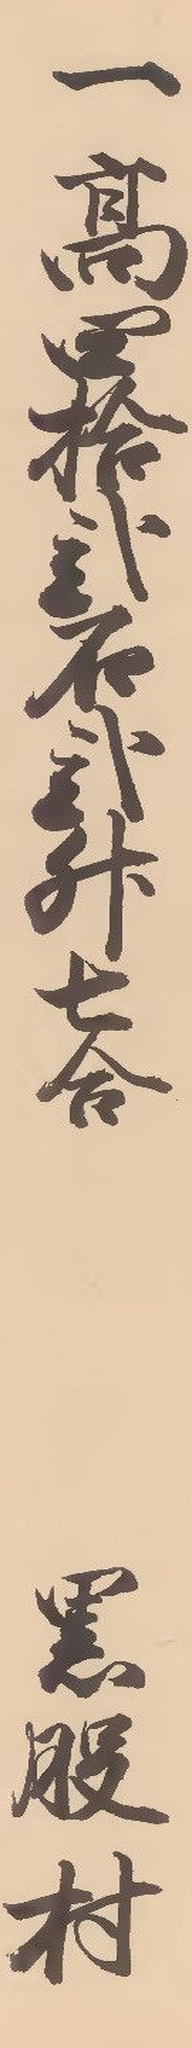一高四拾弐石弐升七合黒股村
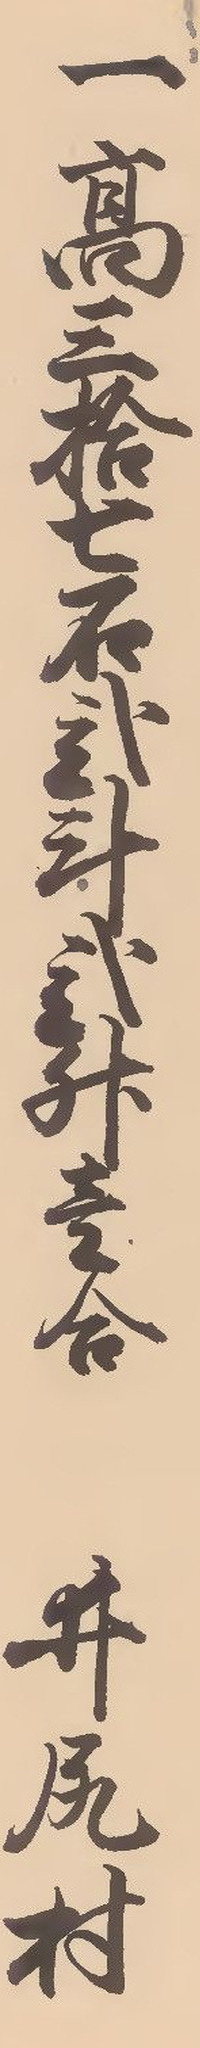一高三拾七石弐斗弐升壱合井尻村
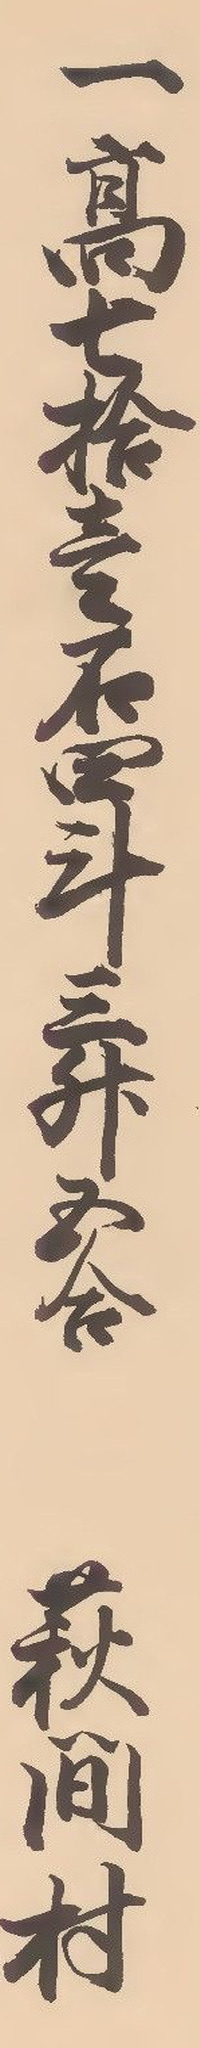一高七拾壱石四斗三升五合萩間村
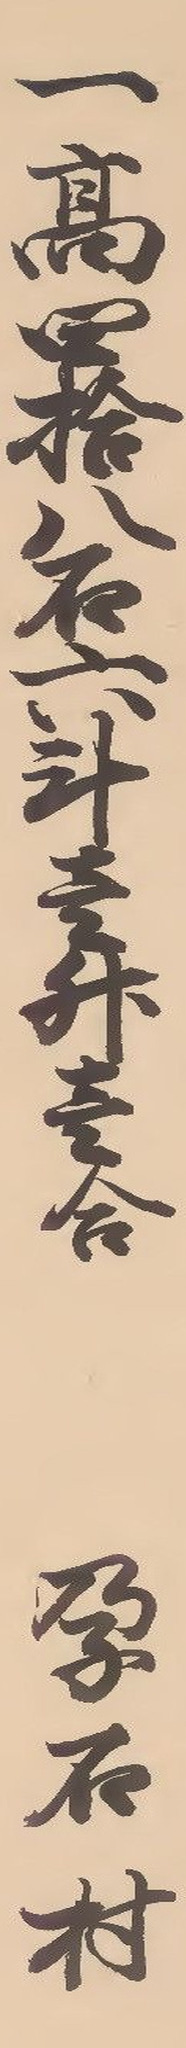一高四拾八石六斗壱升壱合孕石村
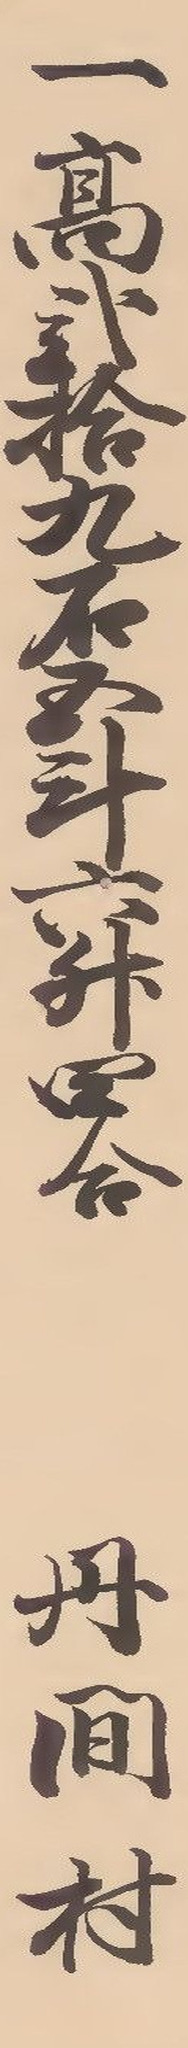一高弐拾九石五斗六升四合丹間村
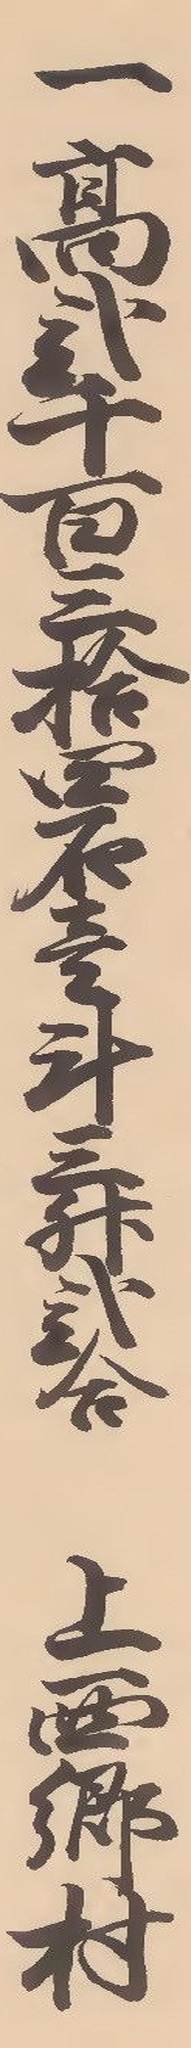一高弐千百三拾四石壱斗三升弐合上西郷村
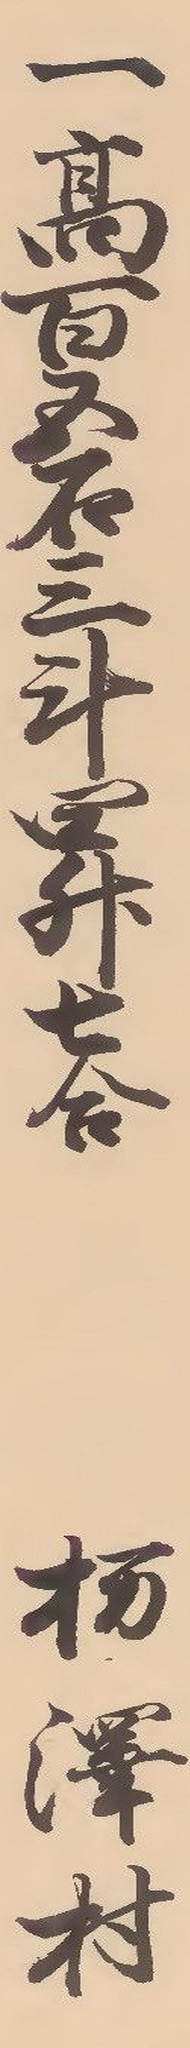一高百五石三斗四升七合栃沢村

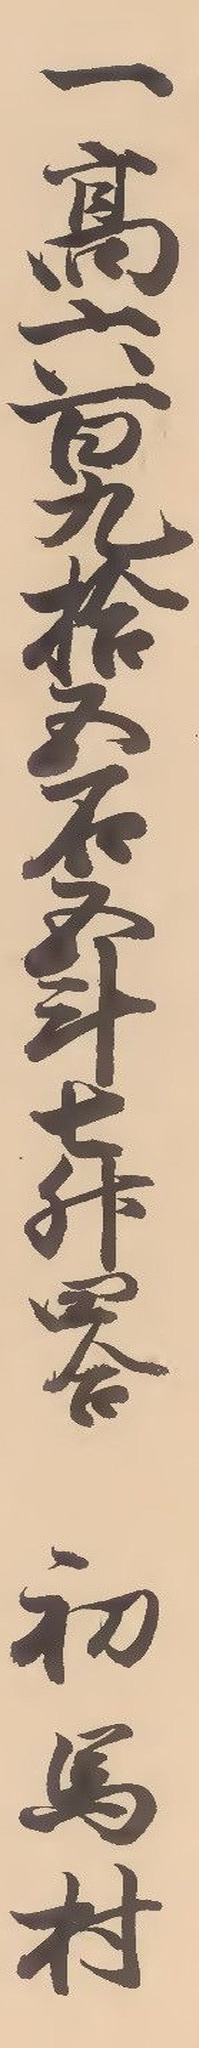一高六百九拾五石五斗七升四合初馬村
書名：遠江国郷帳
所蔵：国立公文書館 National Archives of Japan
